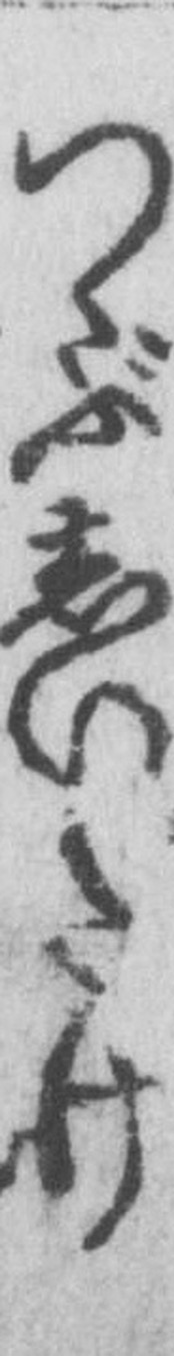生しいたけ
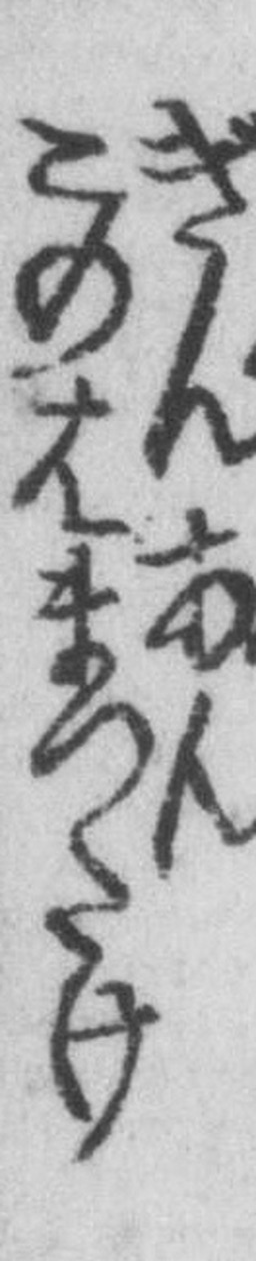このはまつたけ

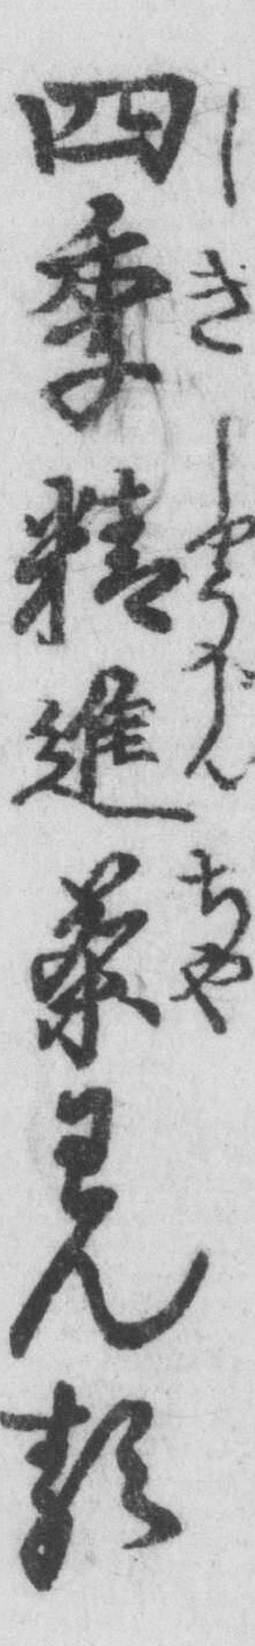四季精進茶わん部
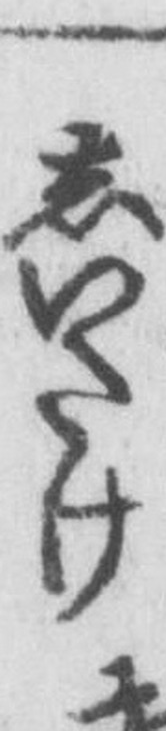しいたけ
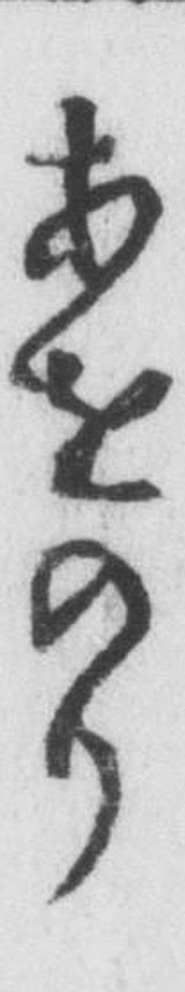あをのり
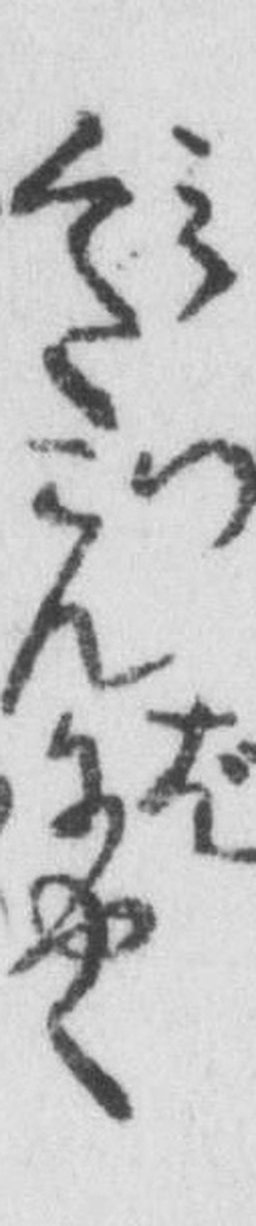くたこんにやく
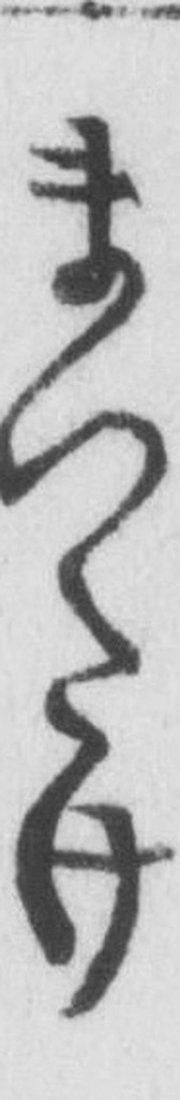まいたけ
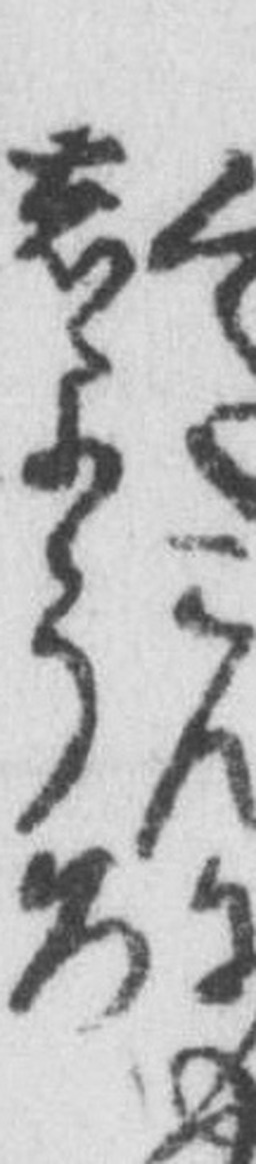しようろ
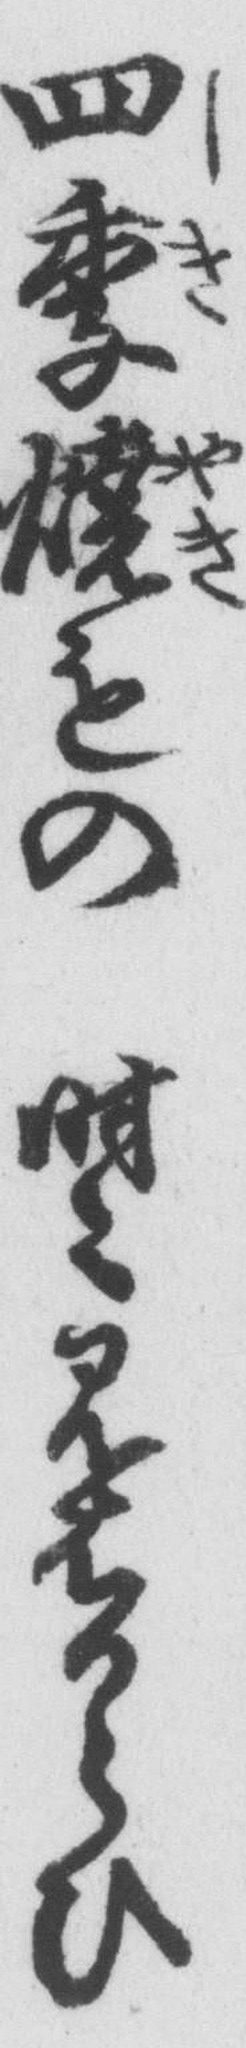四季焼もの時々見はからひ
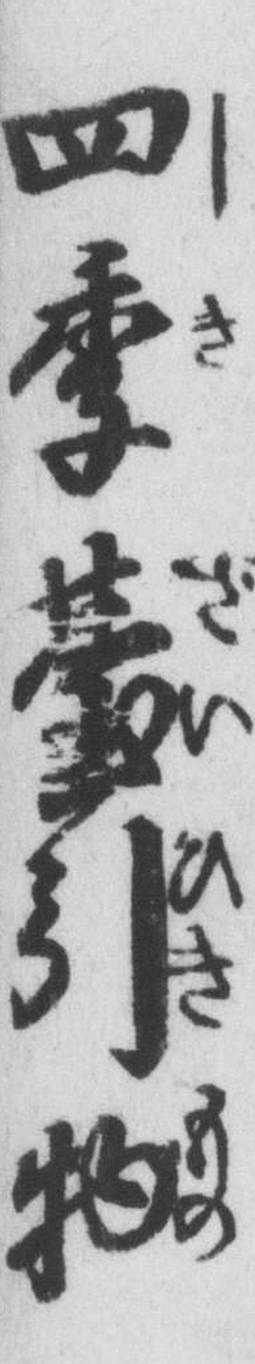四季臺引物
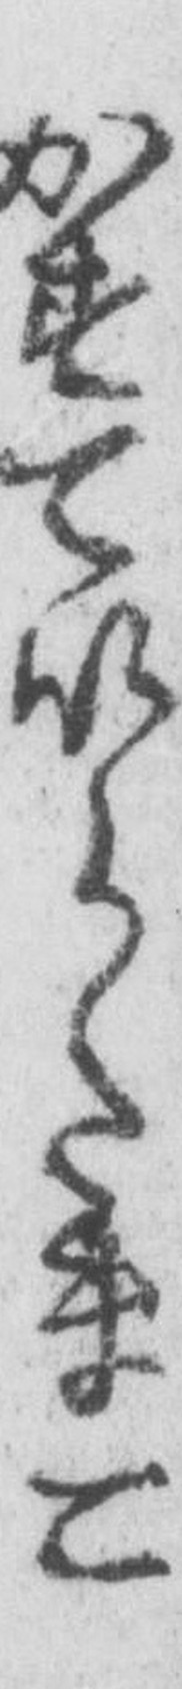かすていらたまこ
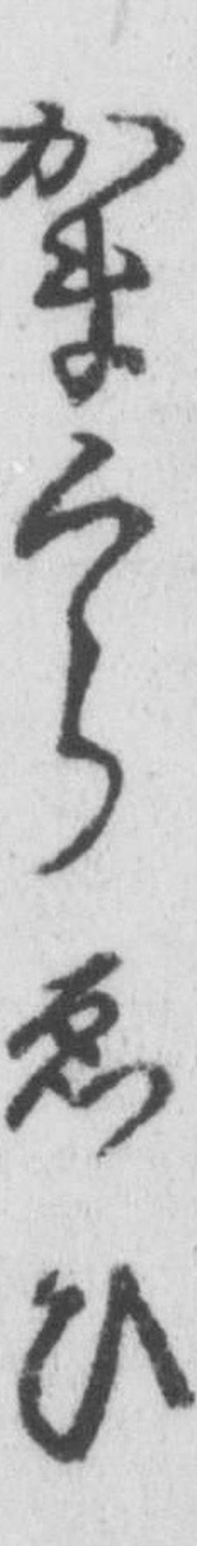かまくらゑひ
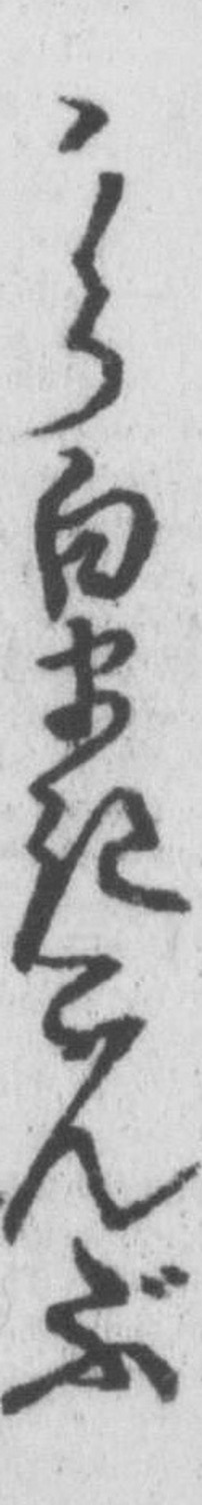うら白まきこんぶ
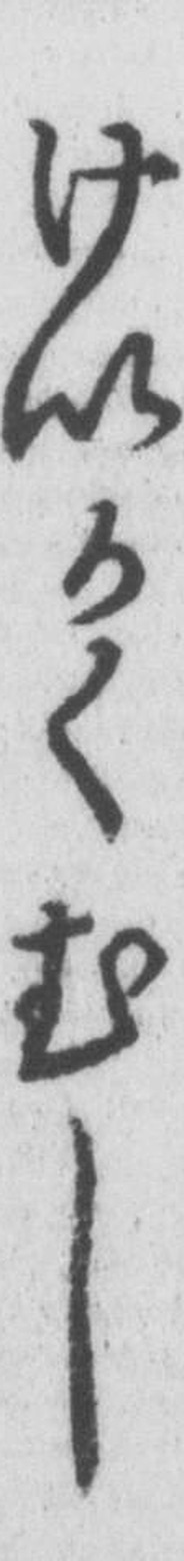けろくむし
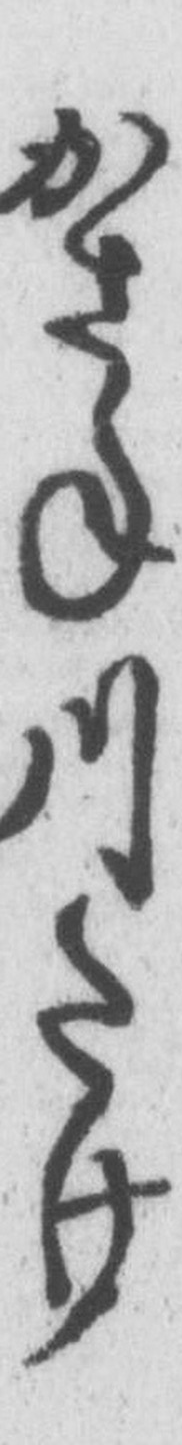かさね川たけ
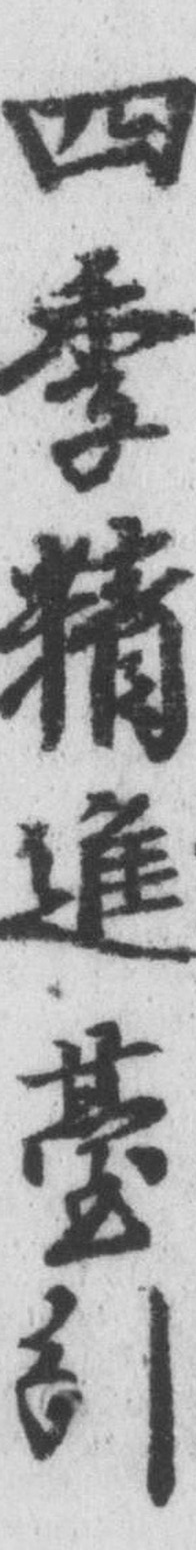四季精進臺引
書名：当世料理献立
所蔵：大阪府立大学学術情報センター 国文学研究資料館
